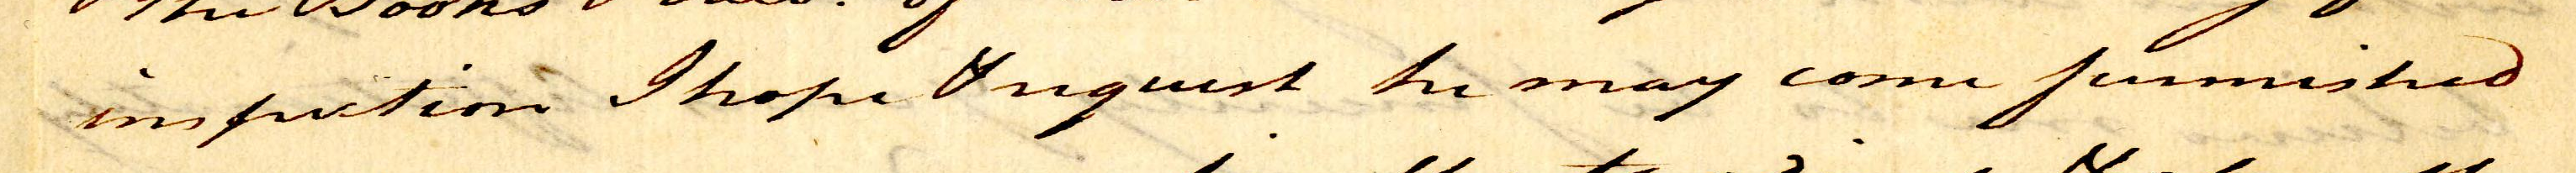imprecision I hope & request he may come furnished
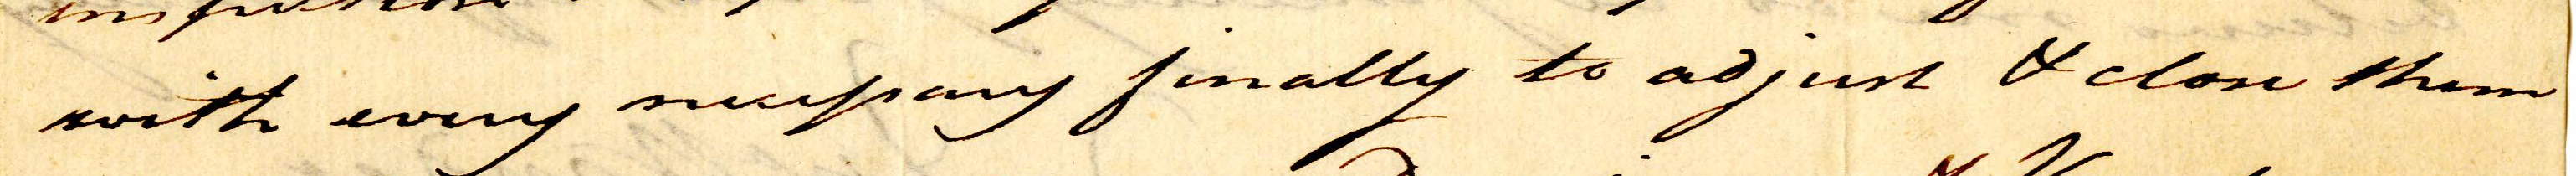with every necessary finally to adjust & close them
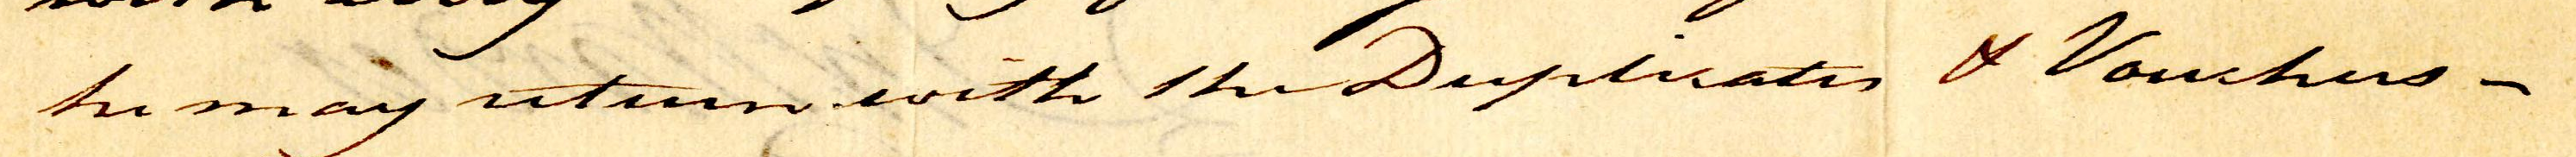he may return with the Duplicates & Vouchers
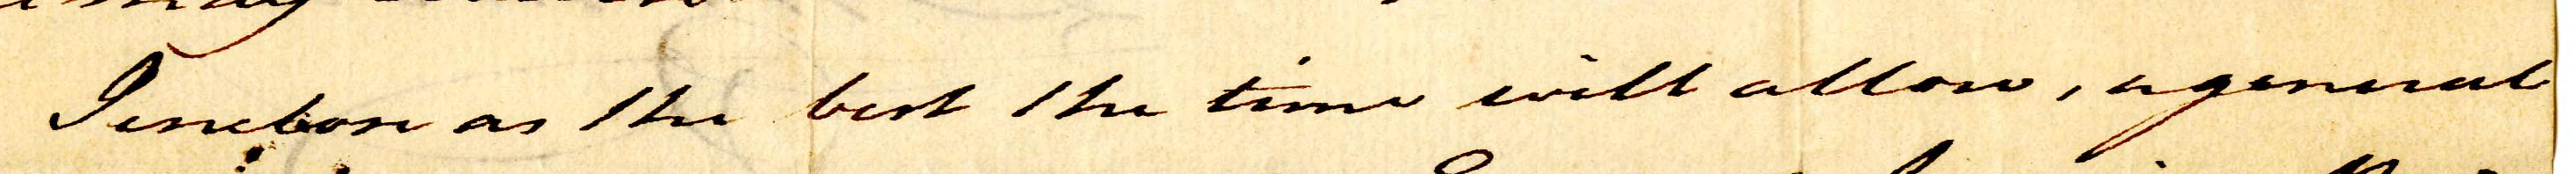I enclose as the best the time will allow, a general
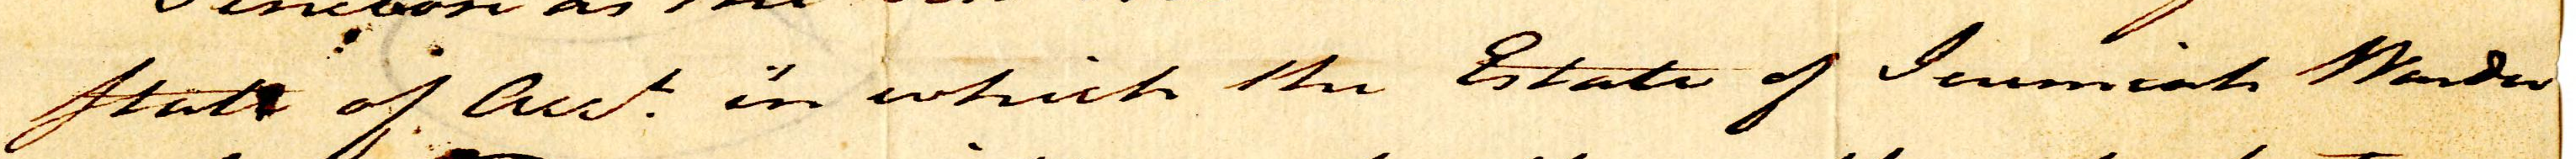state of Acc^t. in which the Estate of Jeremiah Warder
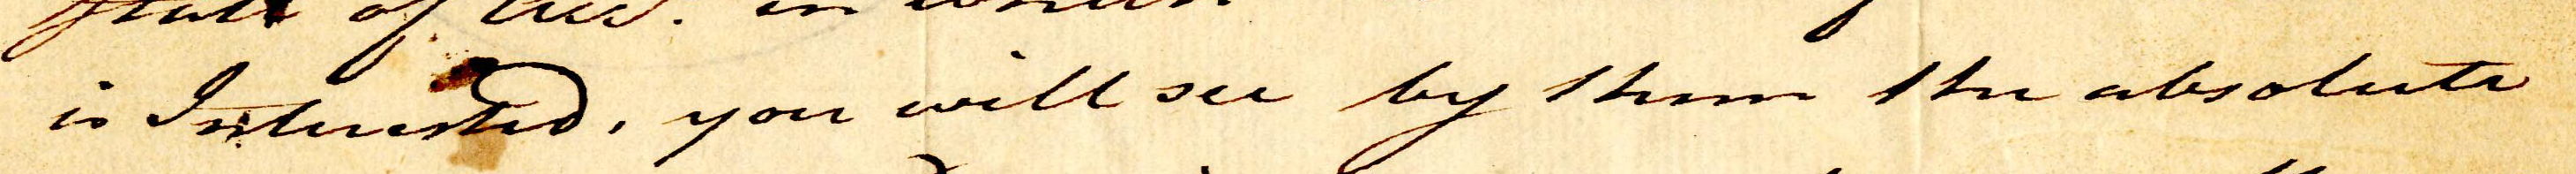is Interested. you will see by them the absolute
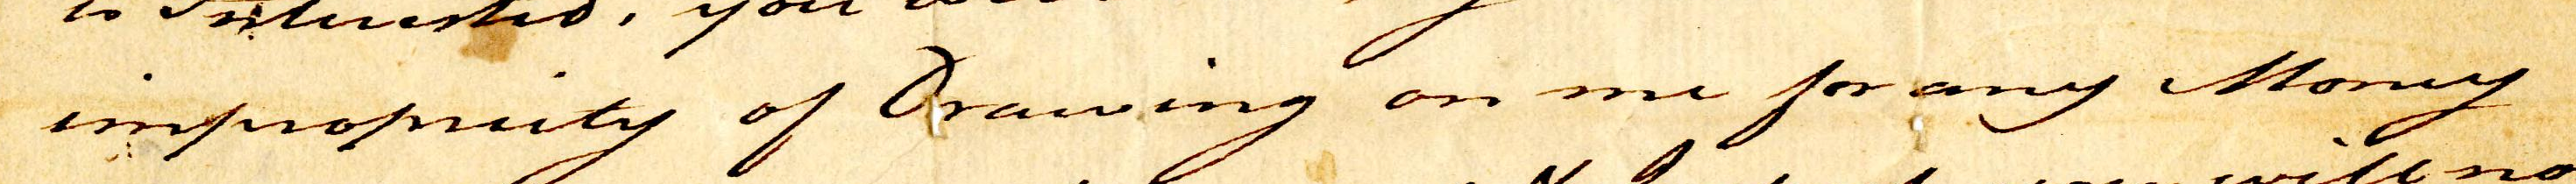impropriety of Drawing on me for any Money
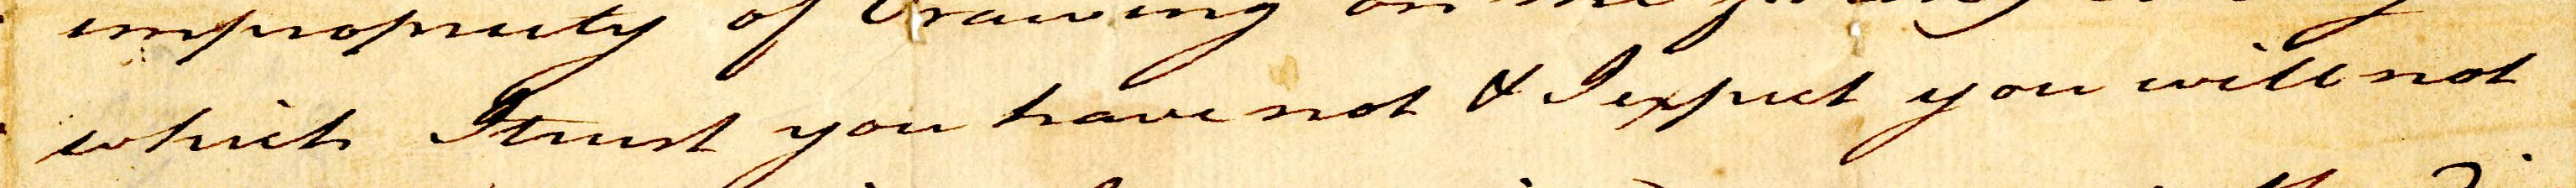which I trust you have not & I expect you will not
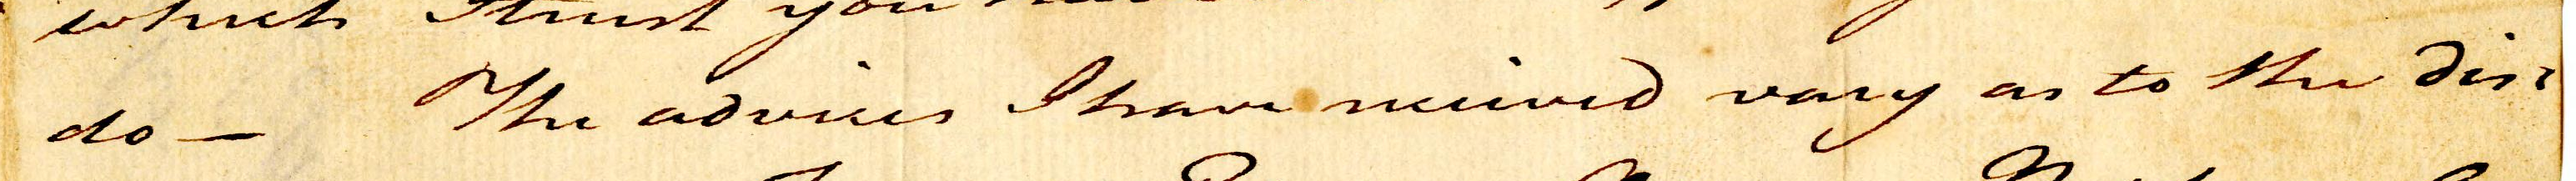do- The advices I have received vary as to the dis-
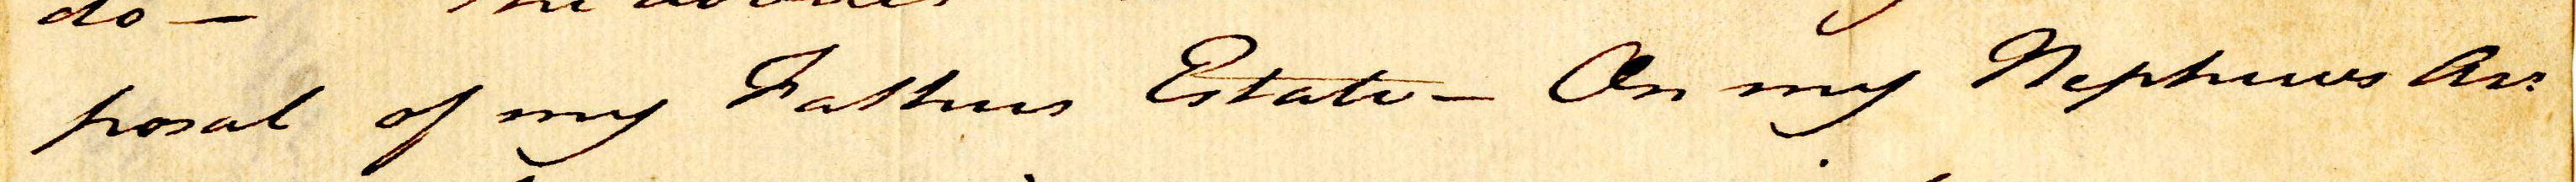-posal of my Fathers Estate. On my Nephews Ar
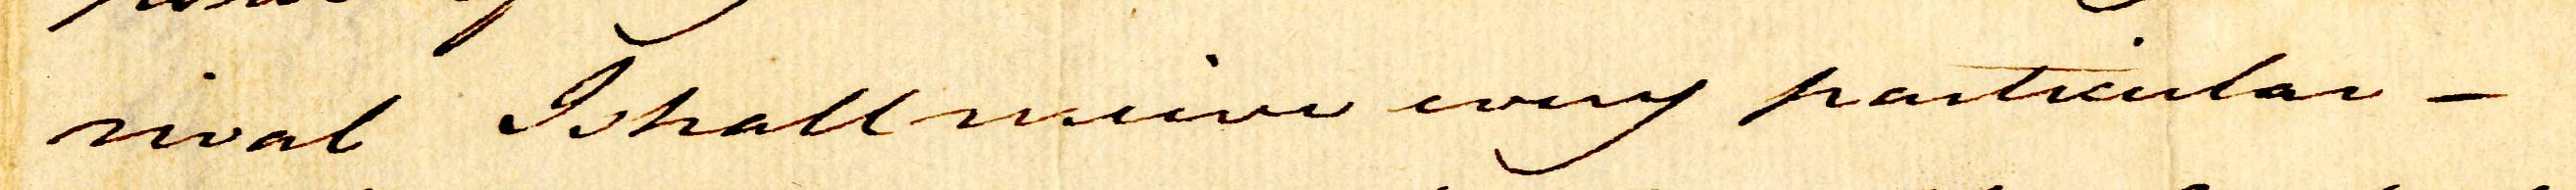rival I shall receive every particular-
